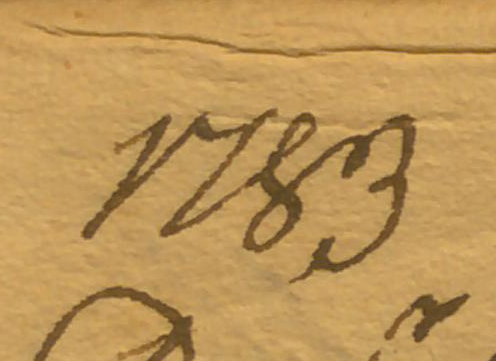1783
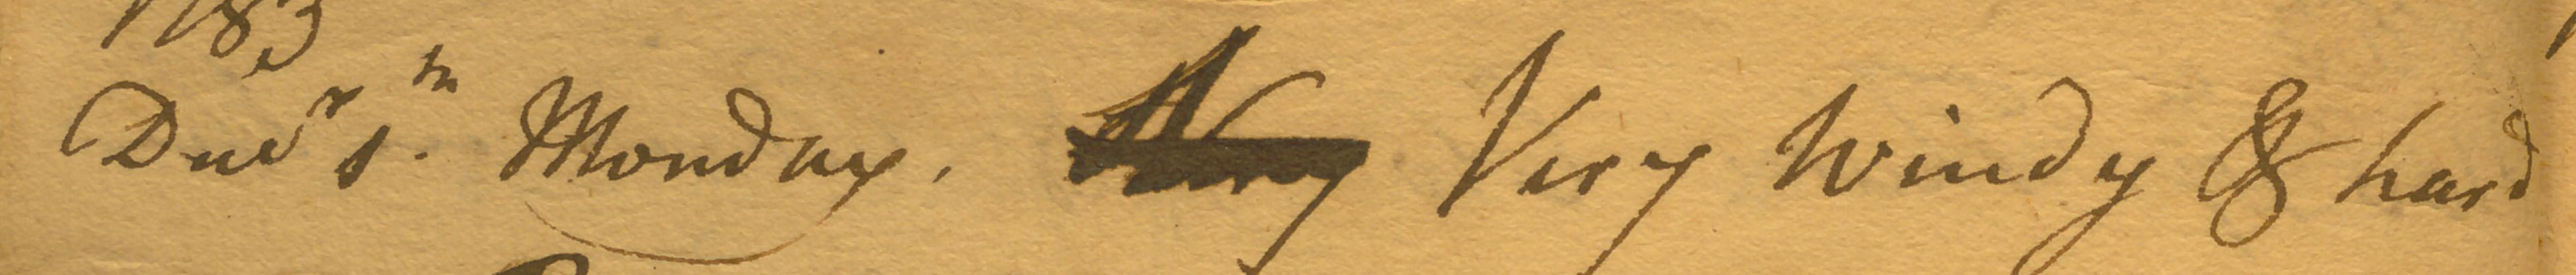Dec^r 1^th. Monday, [____] Very Windy & hard
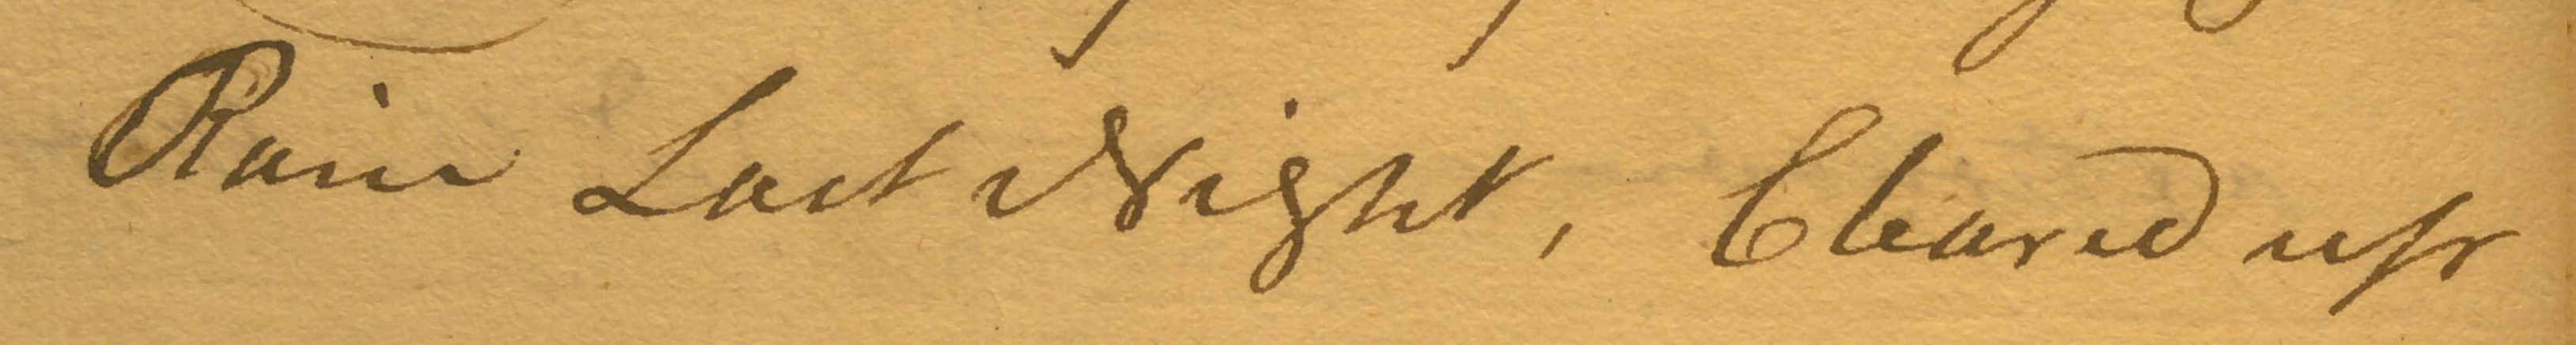Rain Last Night, Cleared up
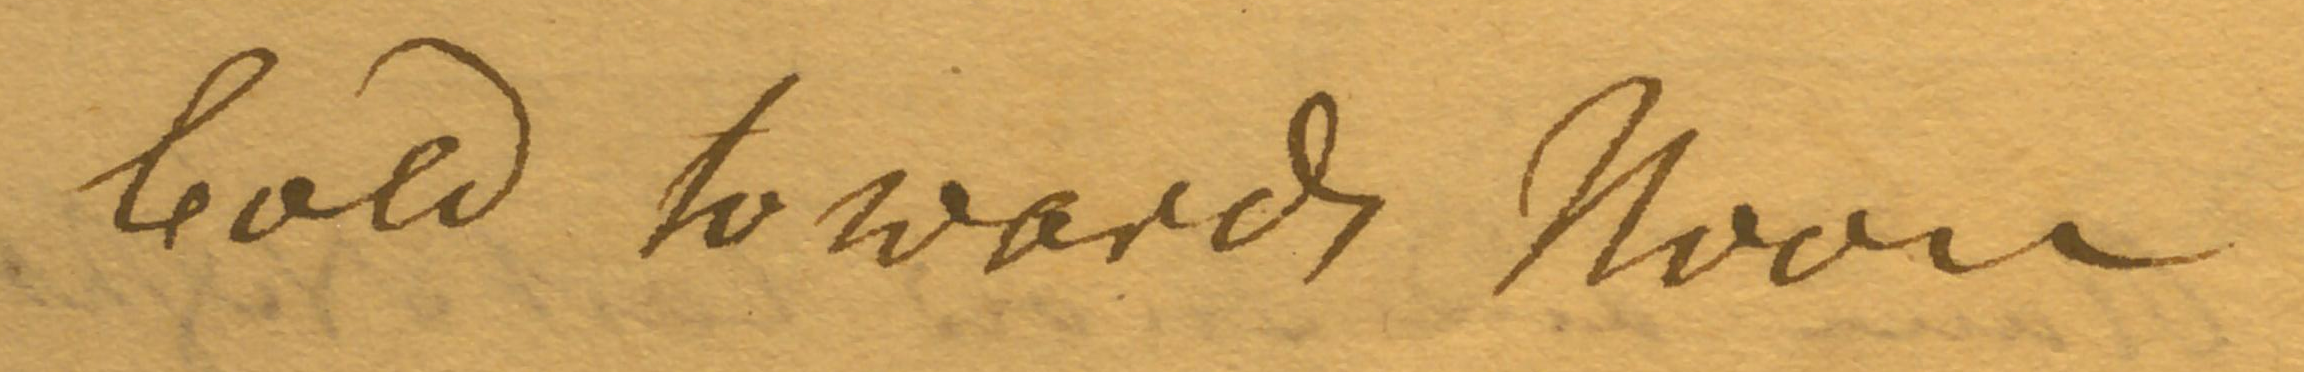Cold towards Noon
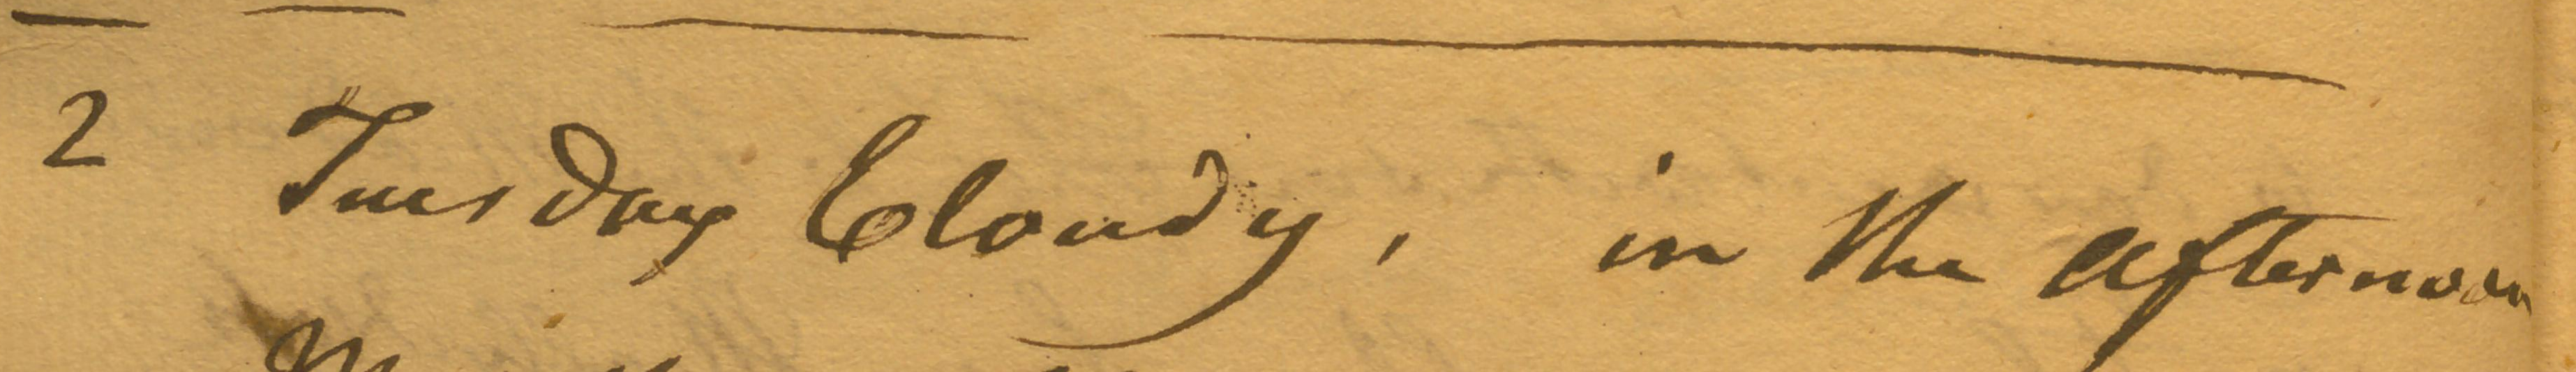2 Tuesday Cloudy, in the afternoon
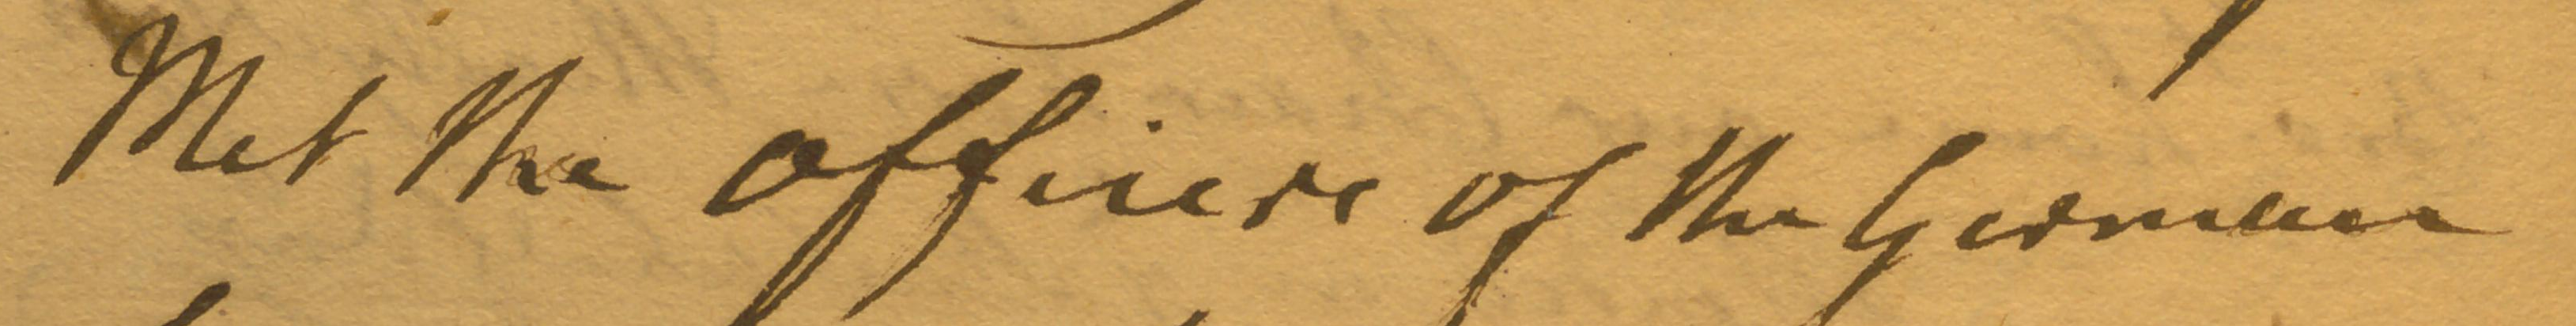Met the officers of the German
